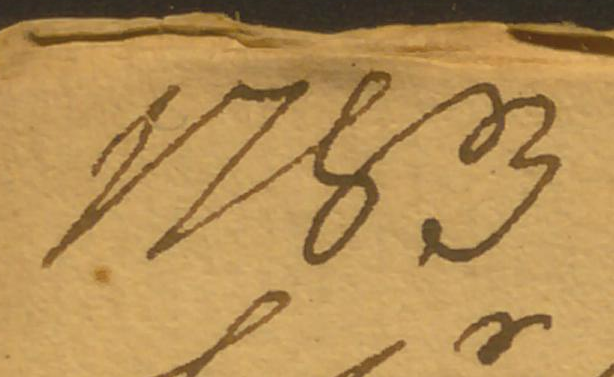1783
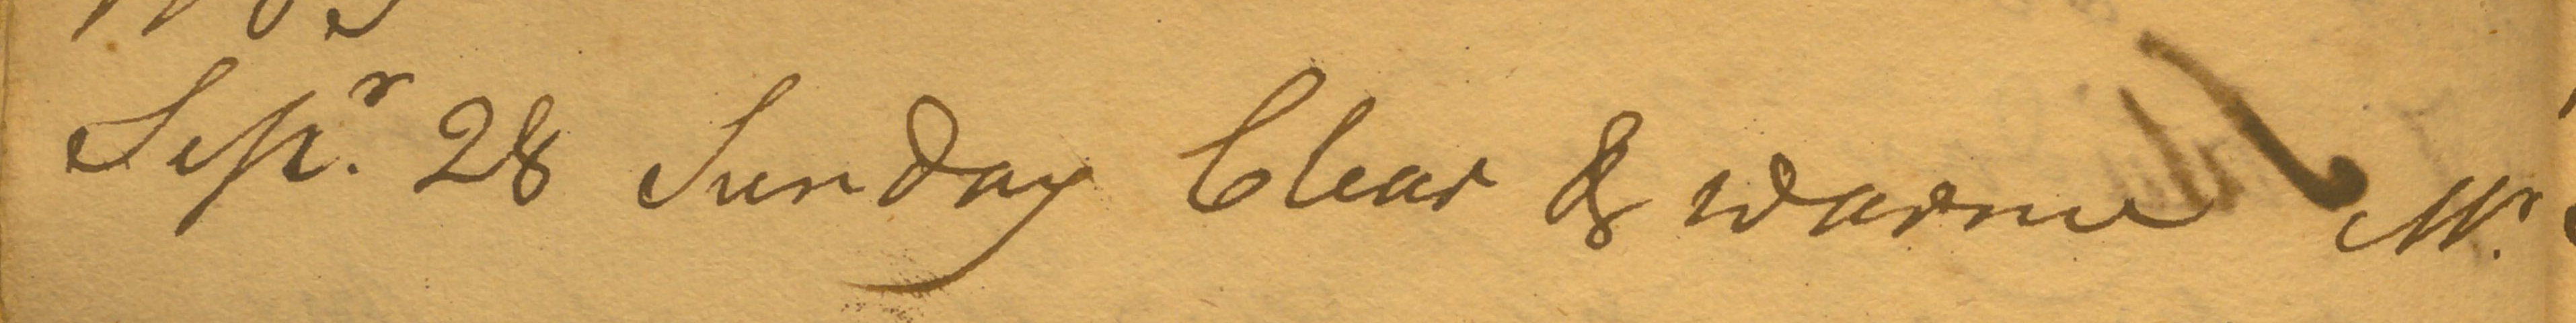Sep^r. 28 Sunday Clear & warme M^r.
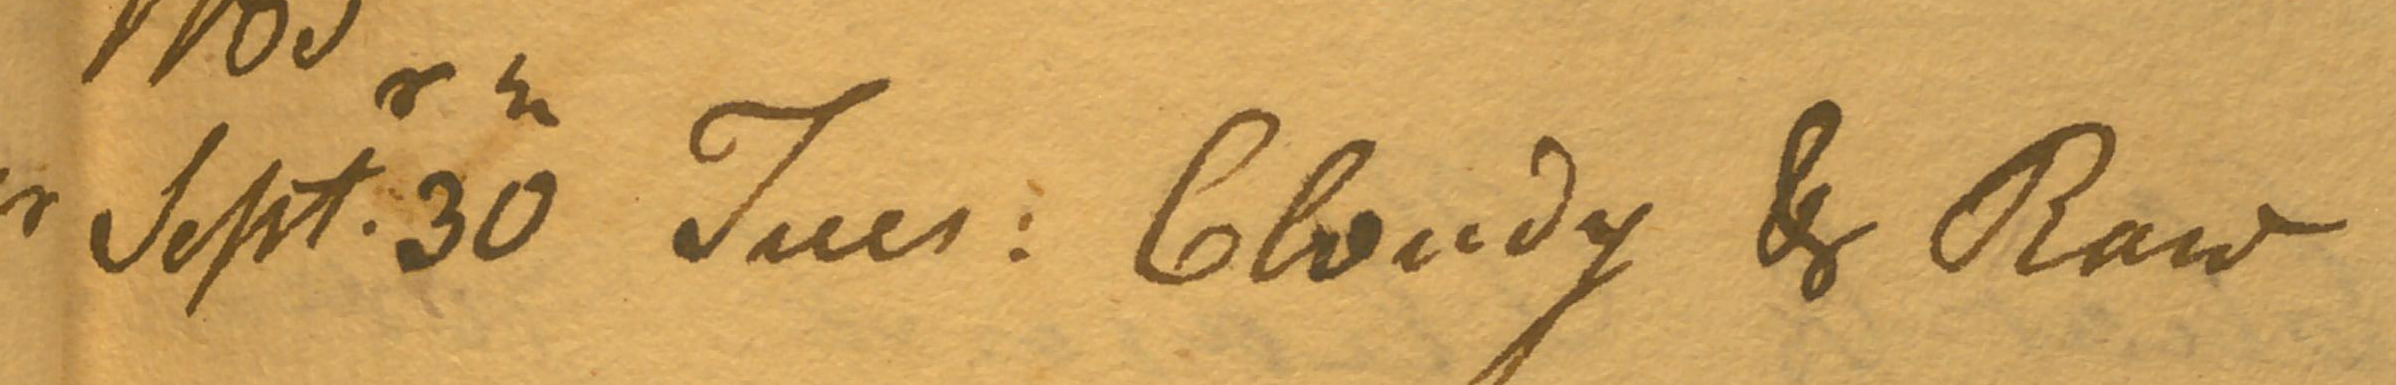Sept^r. 30^th Tues: Cloudy & Raw
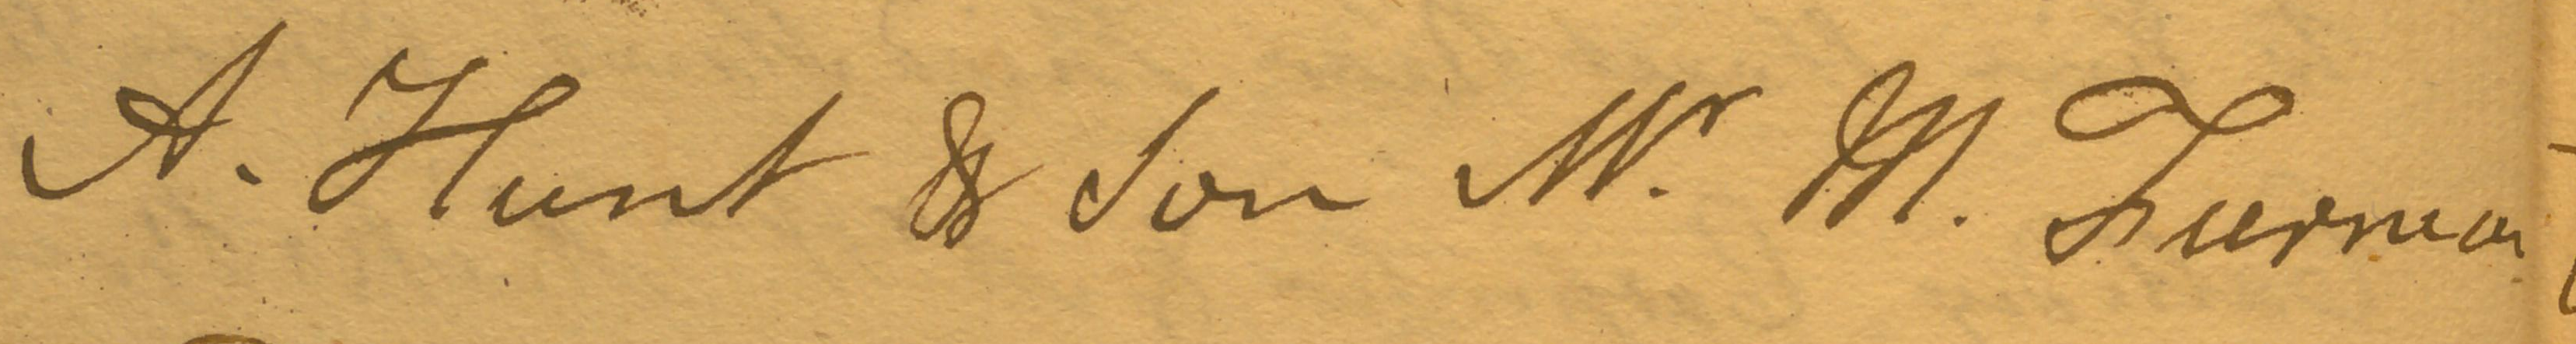A. Hunt & son M^r. M. Furnea
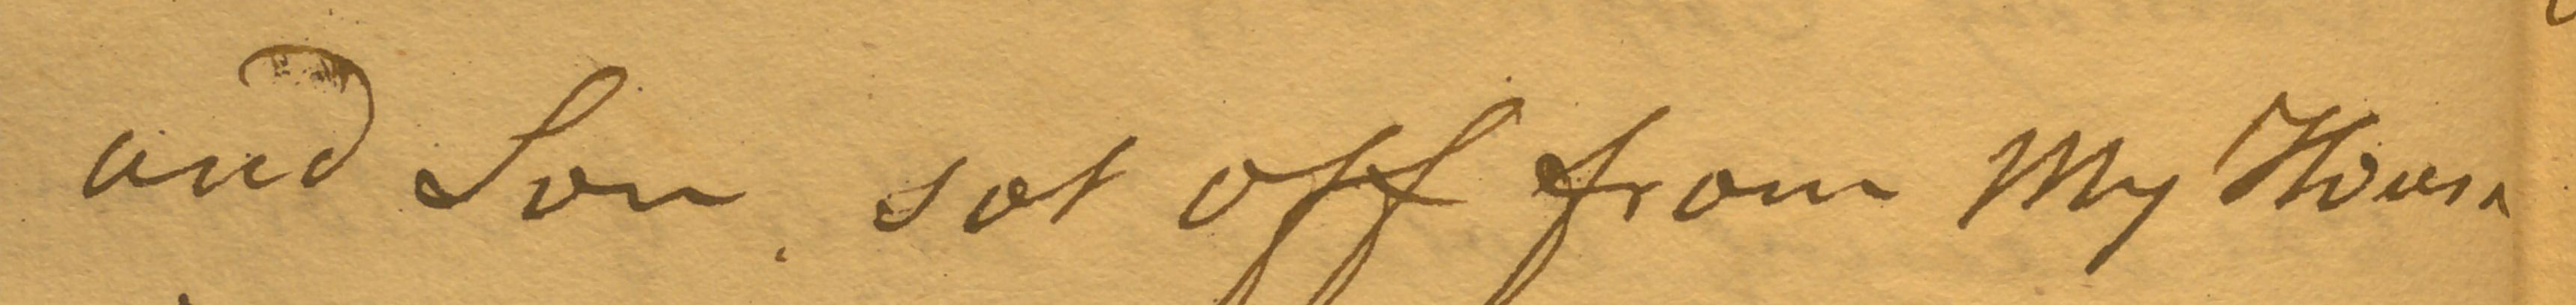and son set off from My House
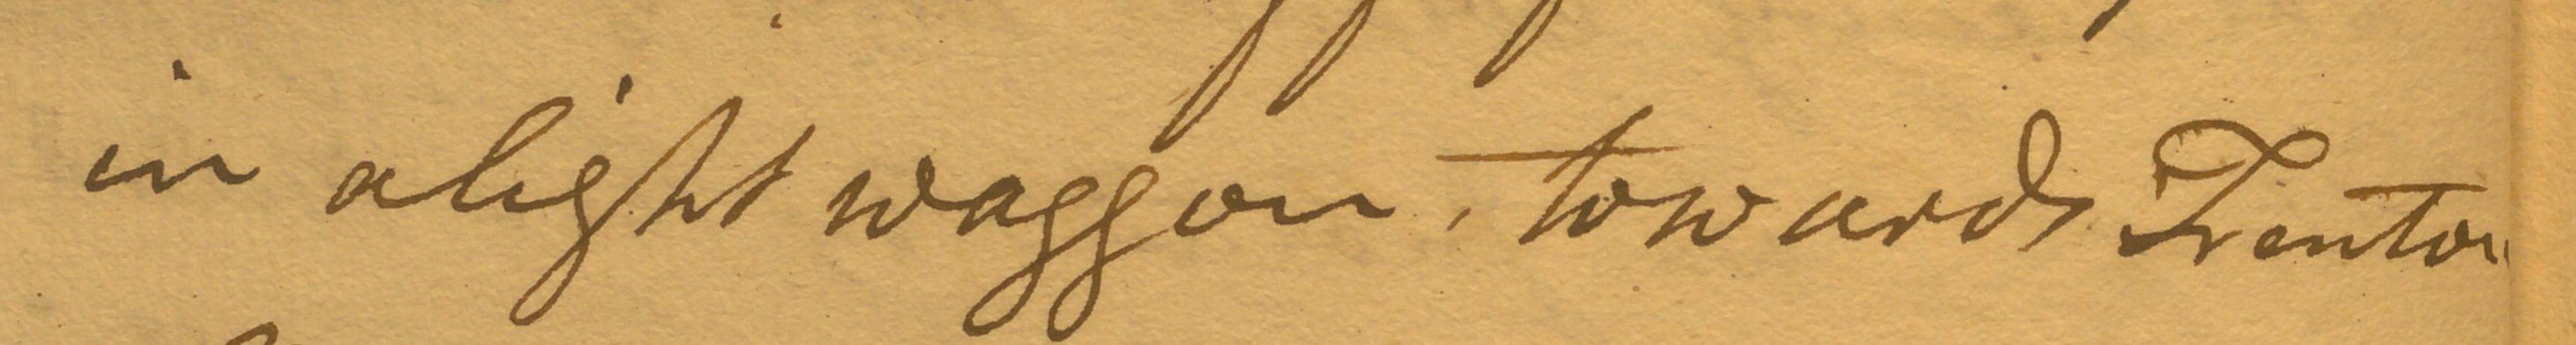in a light waggon, towards Trenton
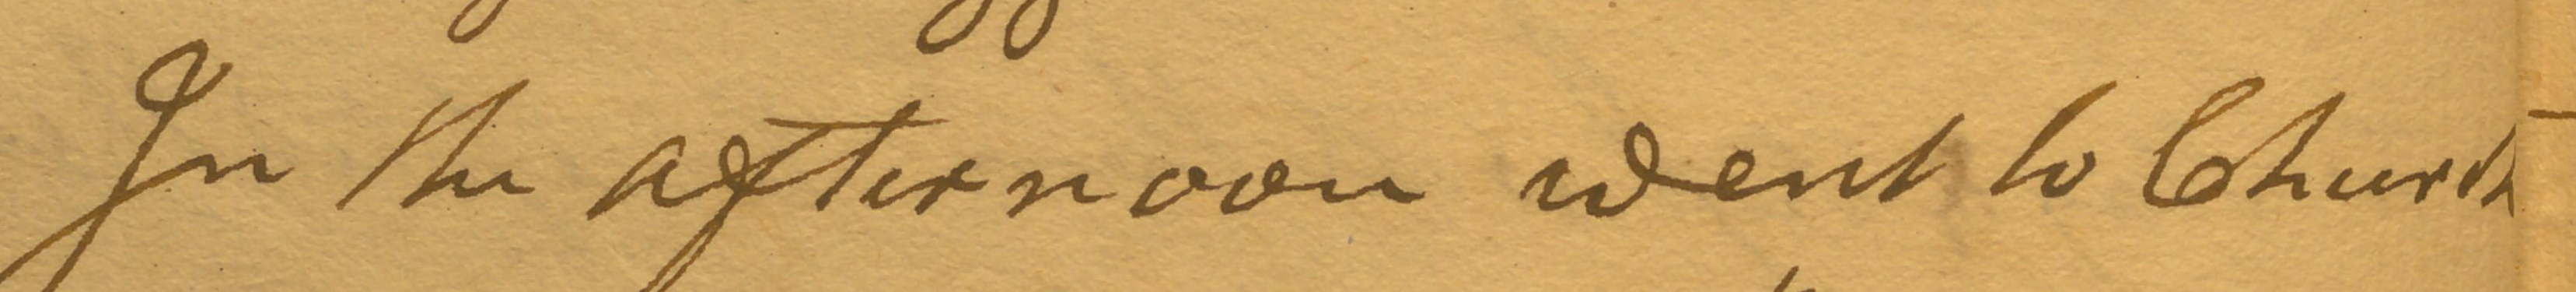In the afternoon went to Church
